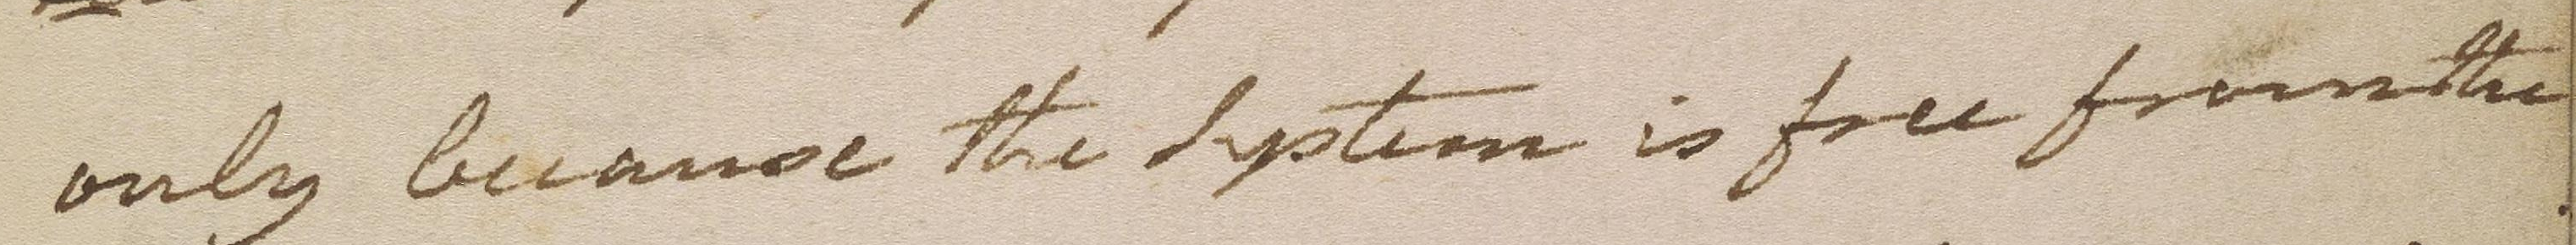only because the System is free from the
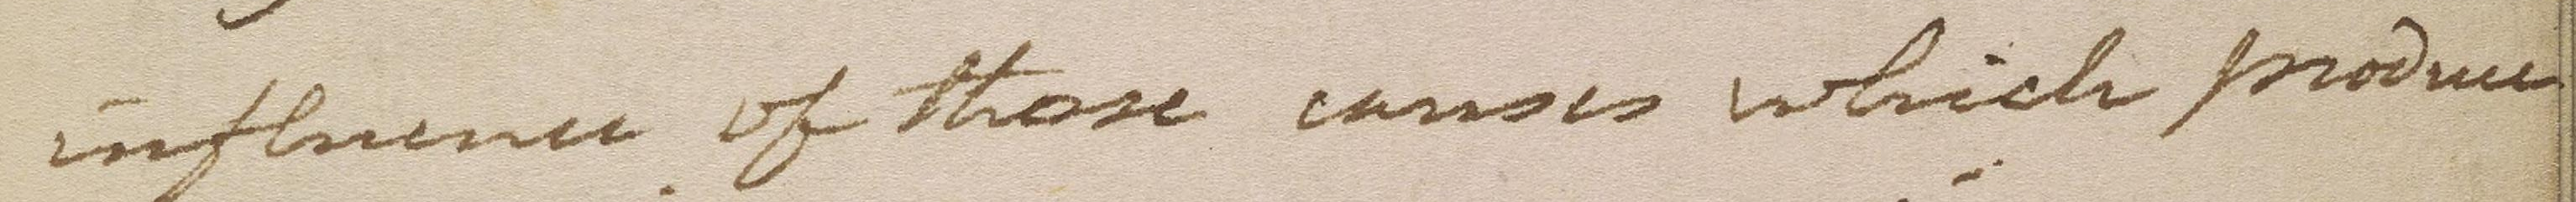influence of those causes which produce
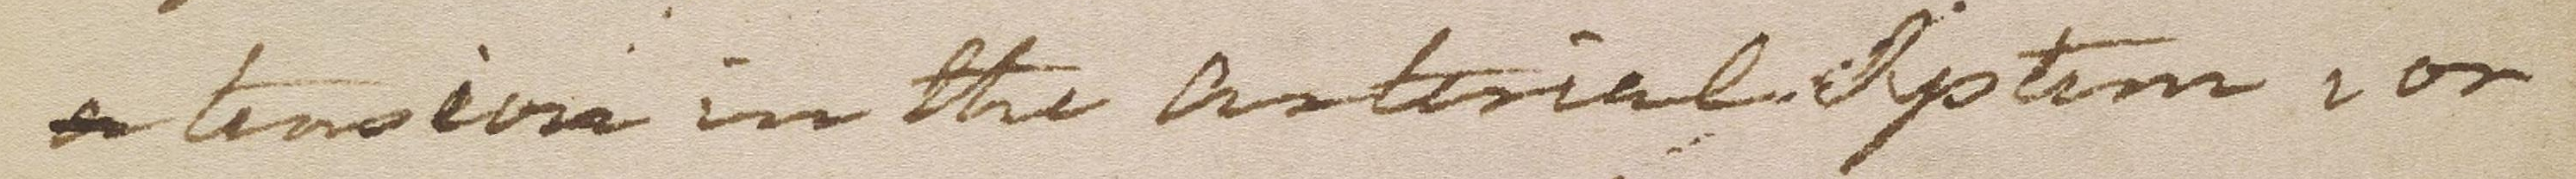[a] tensions in the Arterial System, or
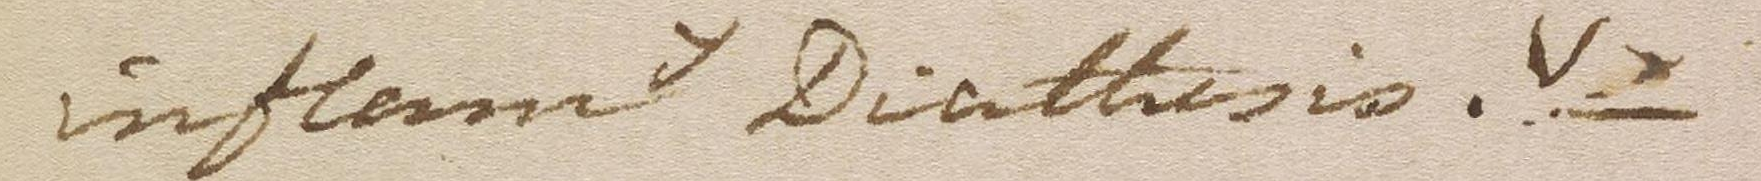inflam^y Diathesis. V
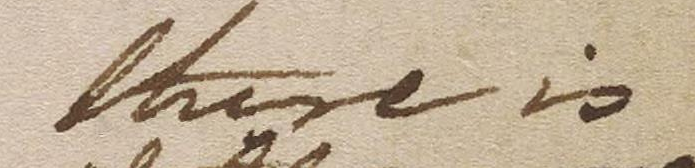there is
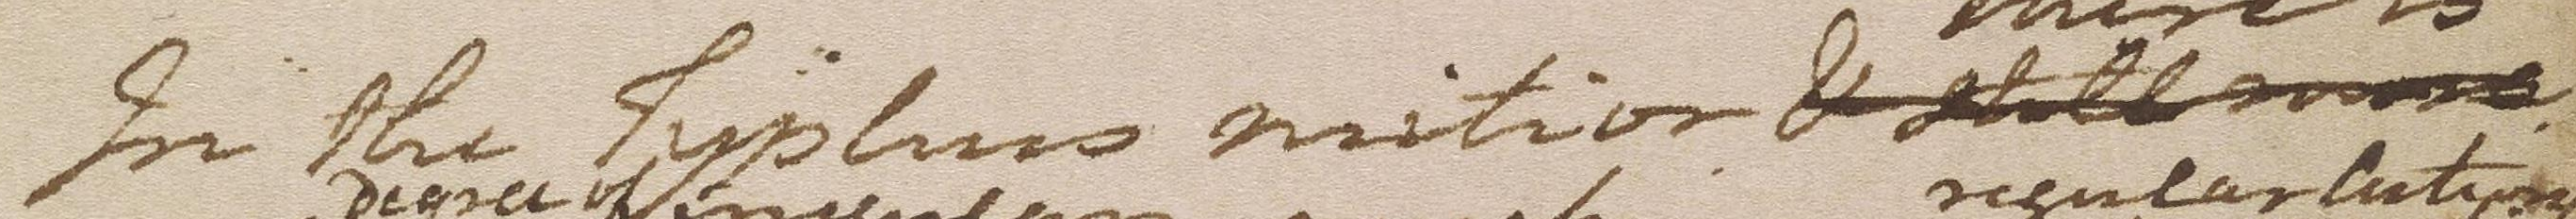In the Typhus mitior & [shall more]
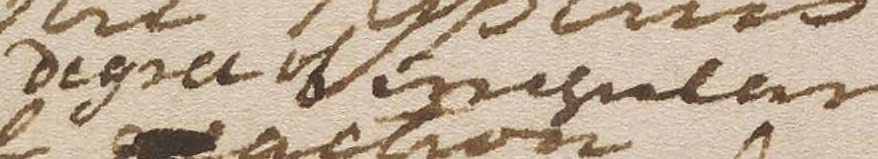degree of irregular
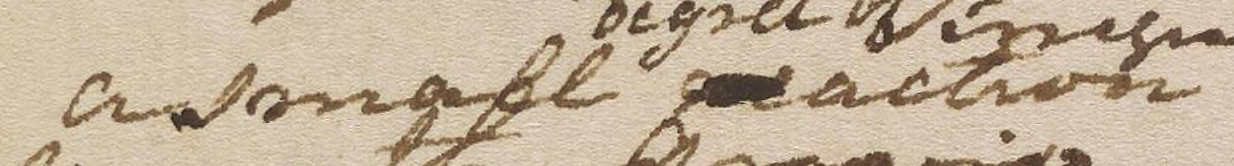a small [re]action
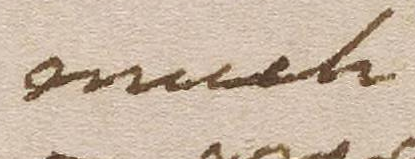much
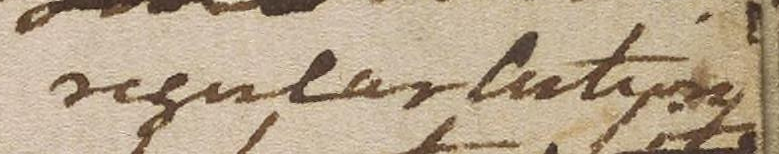regular artery
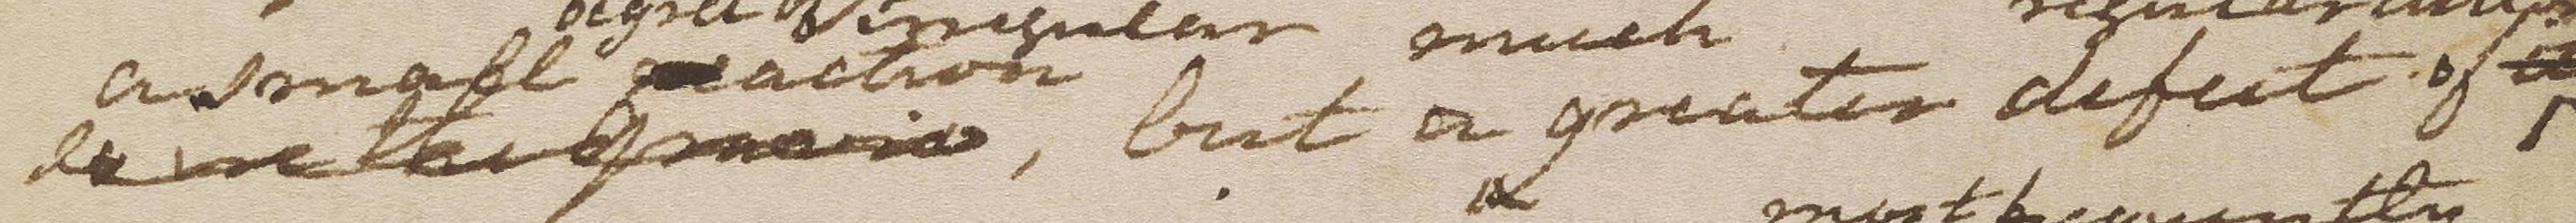[& in the gravior], but a greater defect of ^
